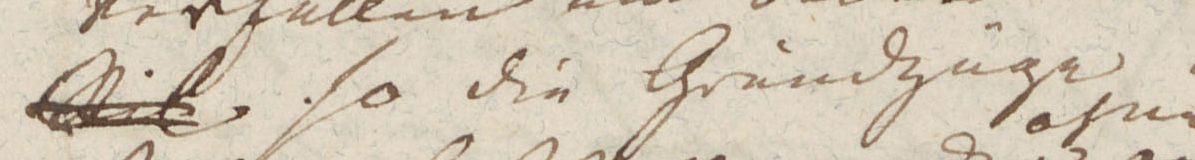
Stil so die Grundzüge
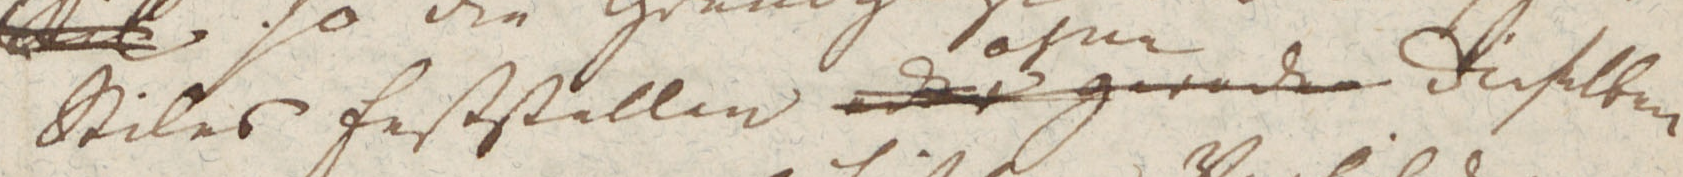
Stiles feststellen oder gerade ohne dieselben
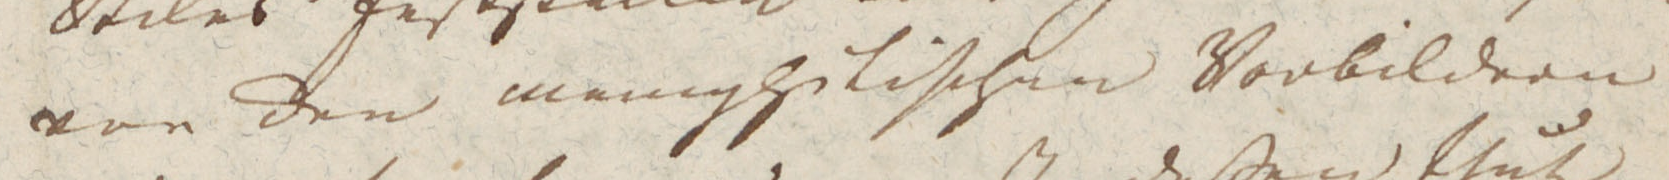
von den memphitischen Vorbildern
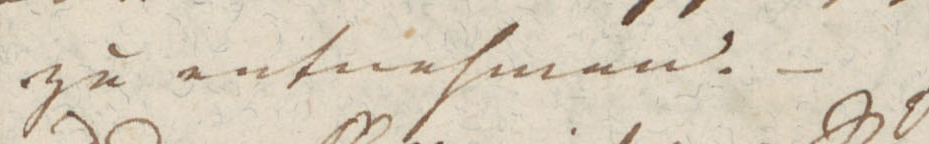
zu entnehmen. –
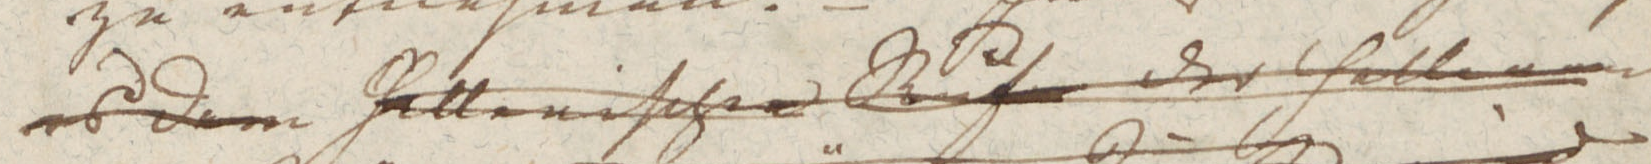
es dem Hellenischen Rufe der Hellenen
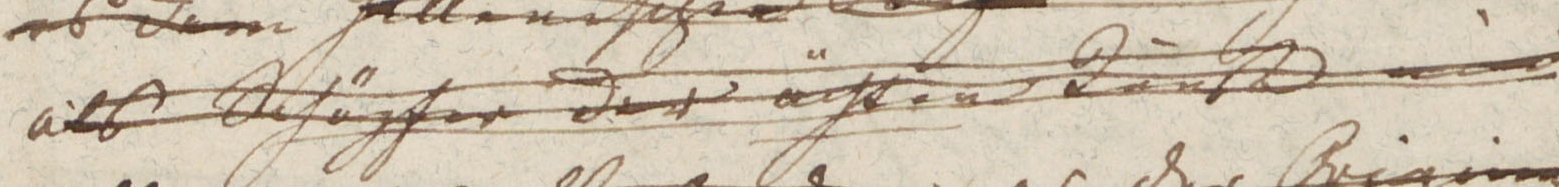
als Schöpfer der ächten Kunst und
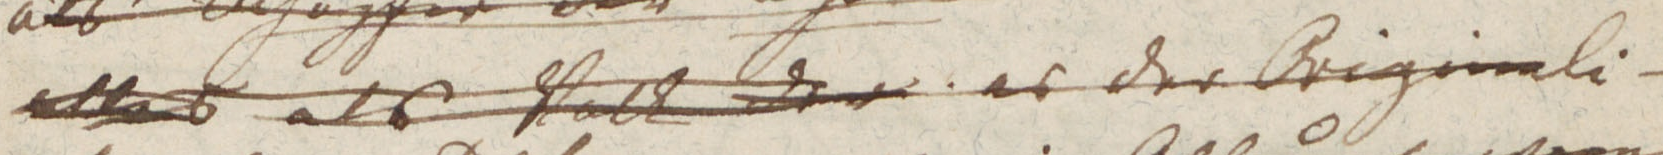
alles als Volk der es der Originali-
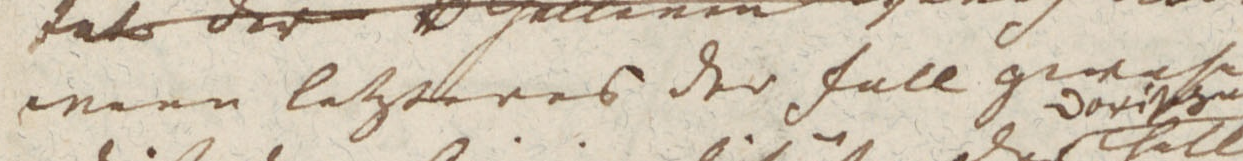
wenn letzteres der Fall gewesen
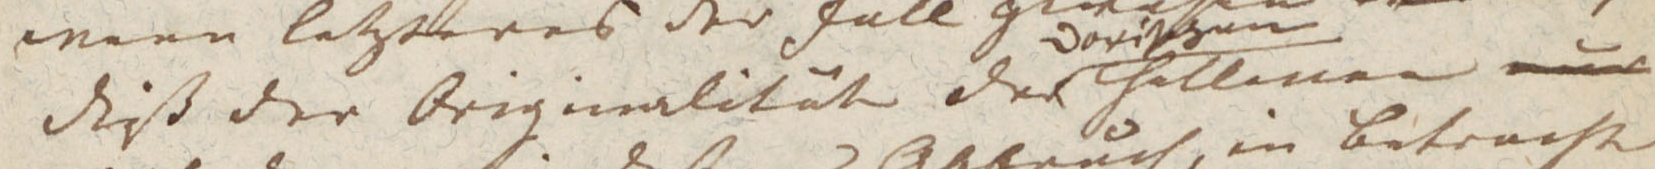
diess der Originalität der Dorischen Hellenen nur
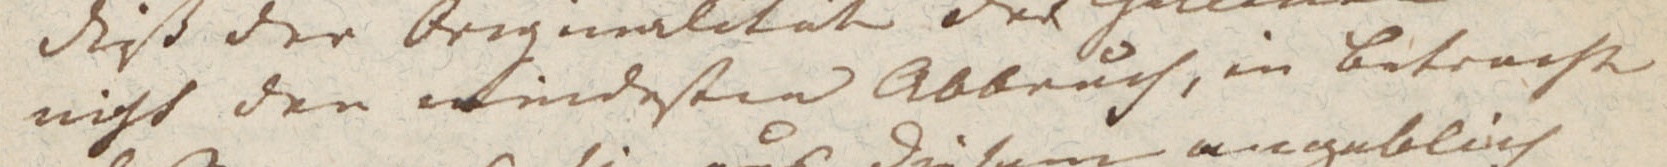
nicht den mindesten Abbruch, in Betracht
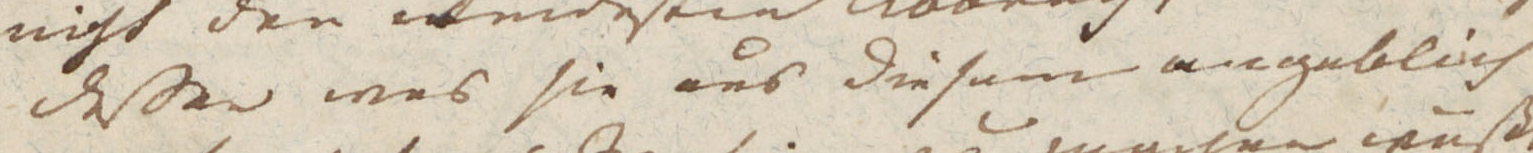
dessen was sie aus diesem angeblich
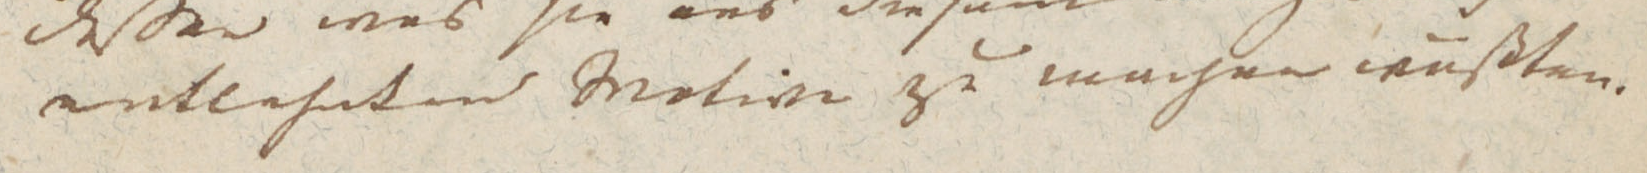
entlehnten Motive zu machen wussten.
